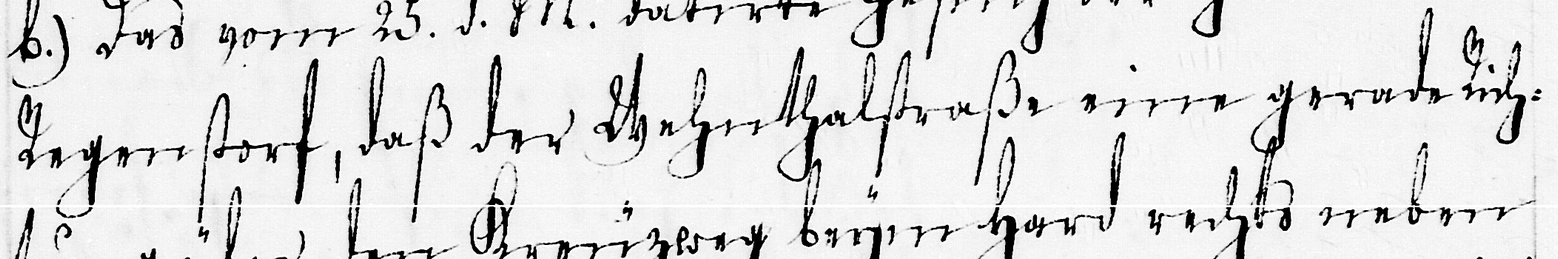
Regenstorf, daß der Wehnthalstraße eine gerade Rich¬
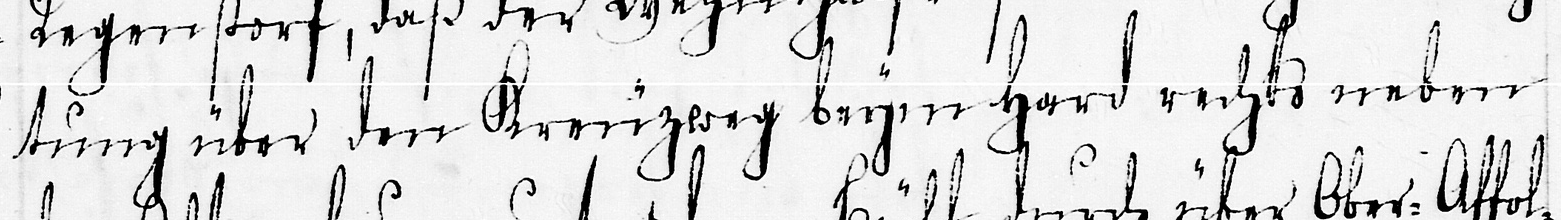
tung über den Kreuzweg beym Hard rechts neben
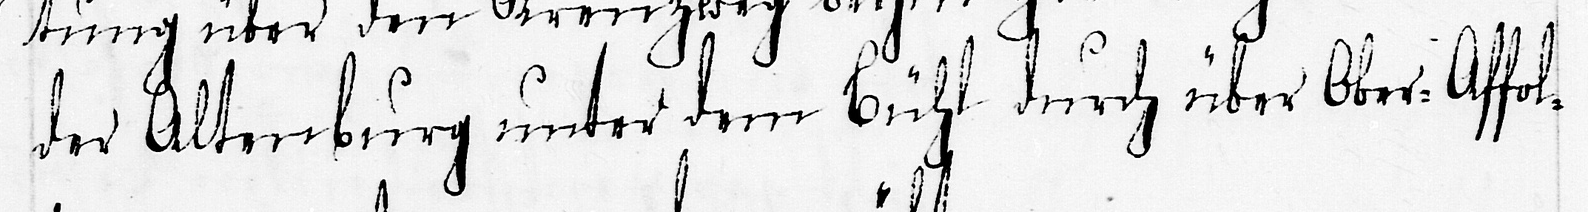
der Altenburg unter dem Bühl durch über Ober-Affol¬
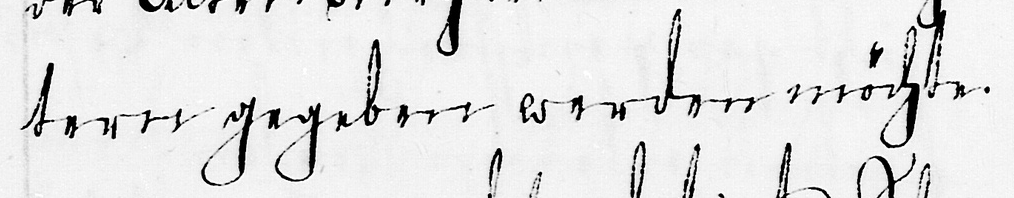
tern gegeben werden möchte.
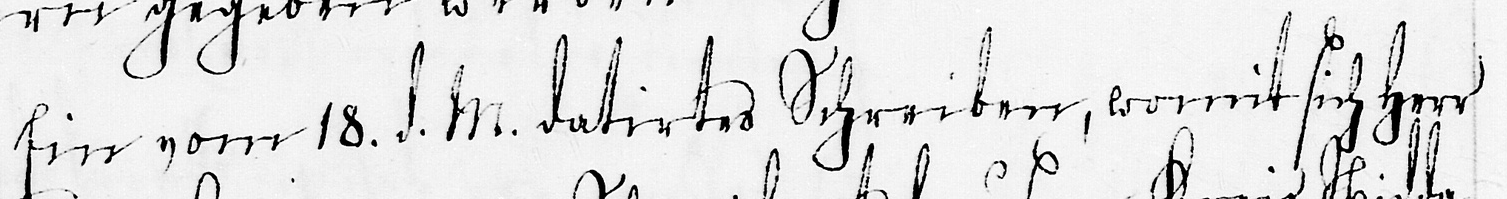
Ein vom 18. d. M. datirtes Schreiben, womit sich Her¬
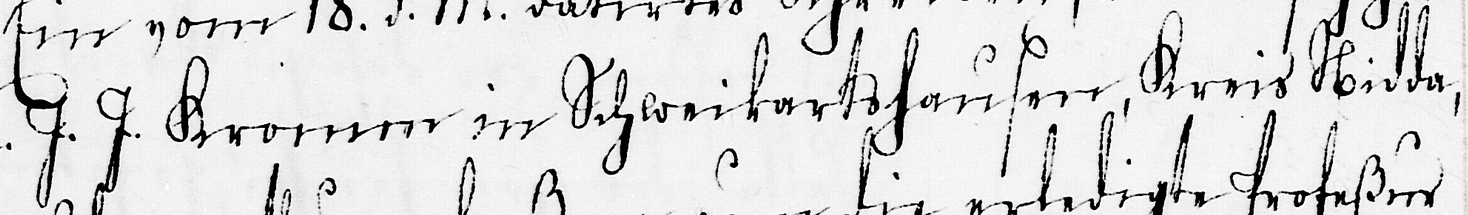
J. J. Kromm in Schweikartshausen, Kreis Nidda,
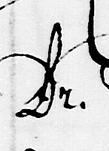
Dr.
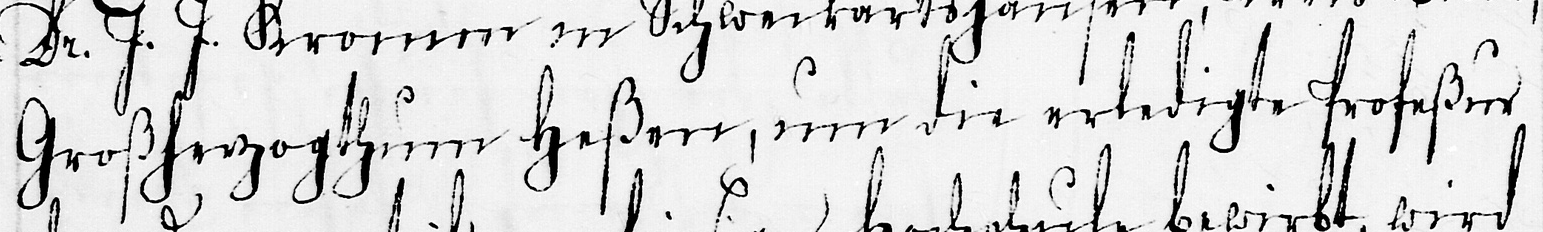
Großherzogthum Heßen, um die erledigte Profeßur
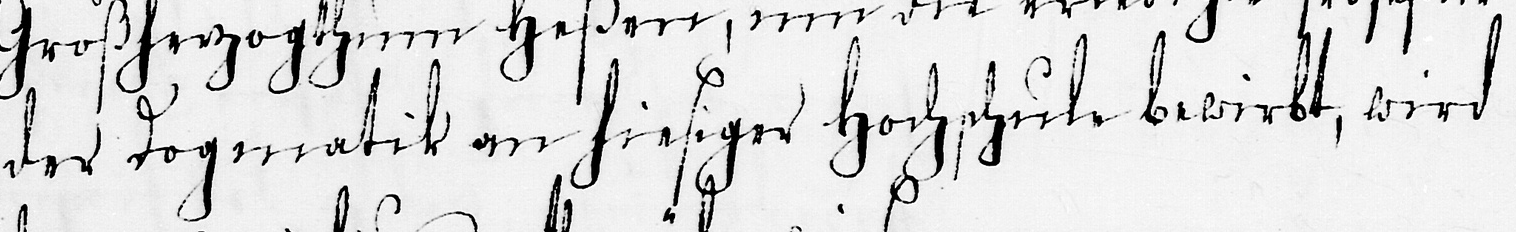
der Dogmatik an hiesiger Hochschule bewirbt, wird
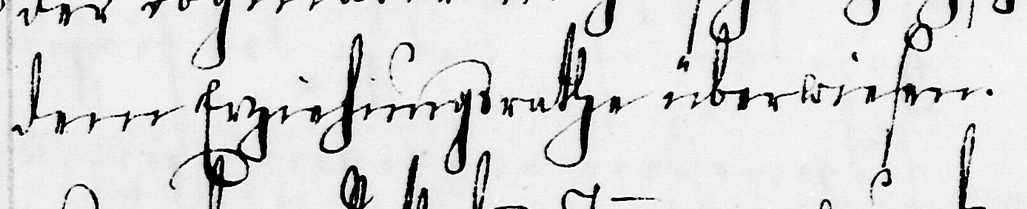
dem Erziehungsrathe überwiesen.
